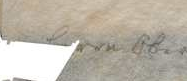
Mein lieber
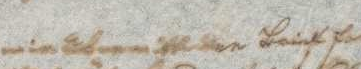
mir übermittelten Brief
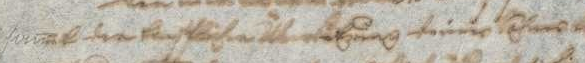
sammt der trefflichen Übersetzung Deines Sohnes le-
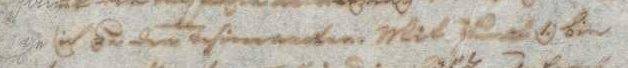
ge ich zu den Tessineracten. Mit Punct 1.) bin
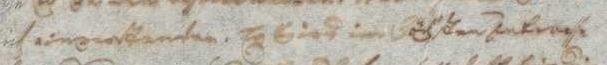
ich einverstanden. Es wird im höchsten Interesse
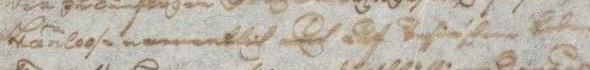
Bauloose namentlich auch auf Tessin'schem Boden
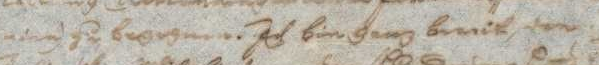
nien) zu begegnen. Ich bin ganz bereit, den
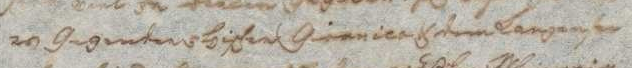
es Gegenden den zwischen Giornico & dem Langensee
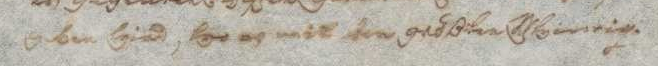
geben wird, wo es mit den größten Schwierig-
